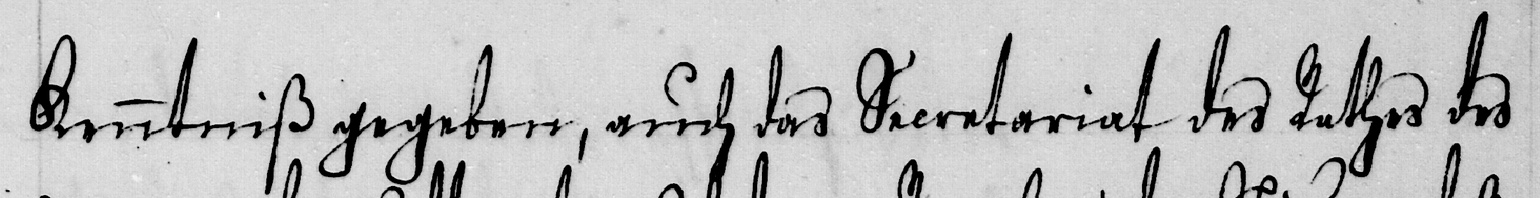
Kenntniß gegeben, auch das Secretariat des Rathes des
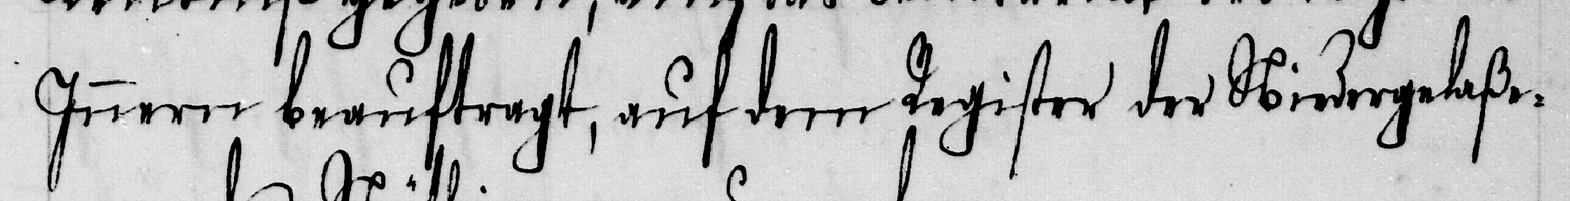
Innern beauftragt, auf dem Register der Niedergelaße¬
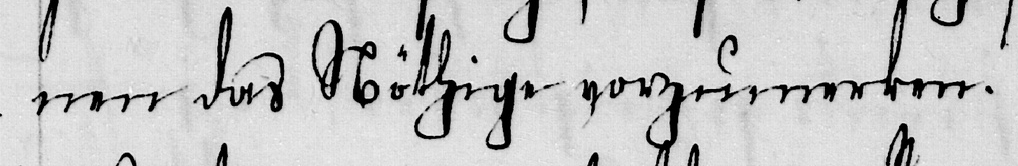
nen das Nöthige vorzumerken.
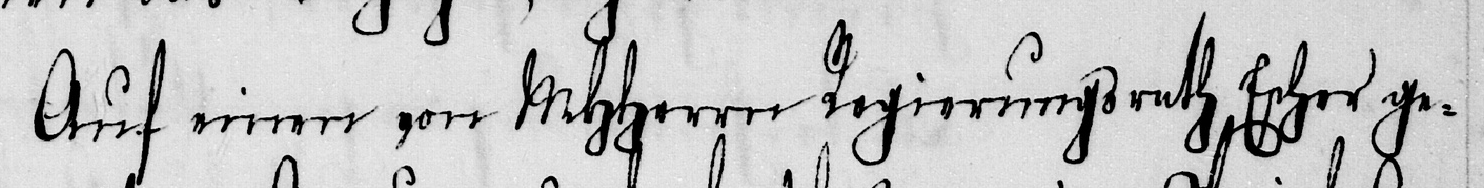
Auf einen von MHHerrn Regierungsrath Escher ge¬
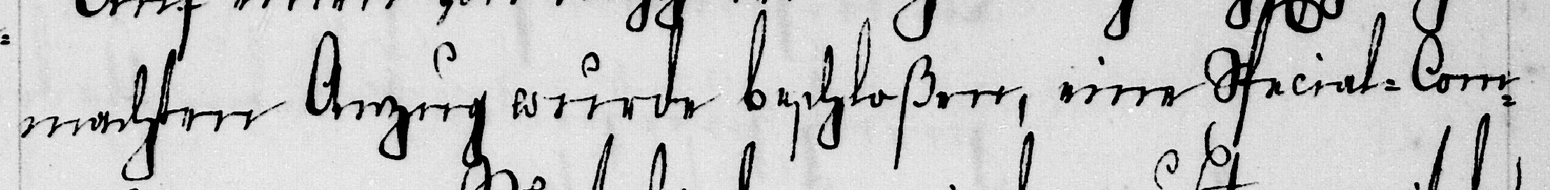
machten Anzug wurde beschloßen, eine Special-Com¬
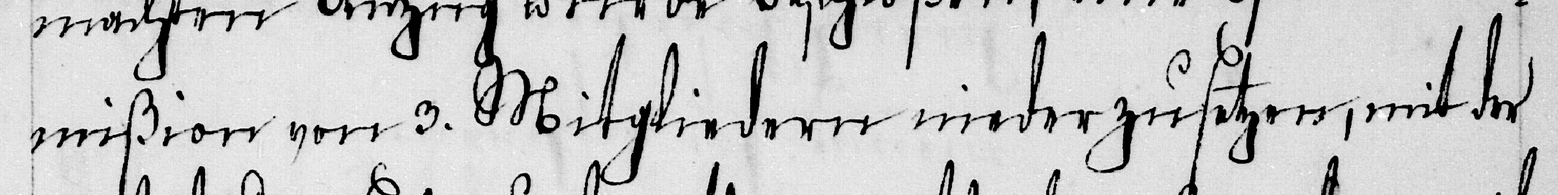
mißion von 3. Mitgliedern niederzusetzen, mit der
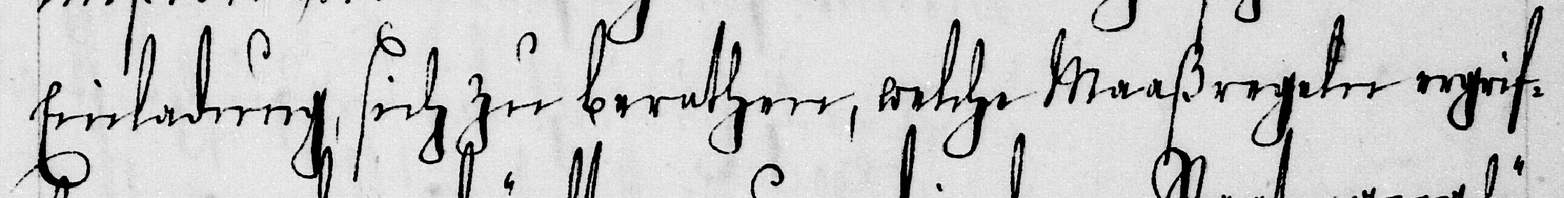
Einladung, sich zu berathen, welche Maaßregeln ergrif¬
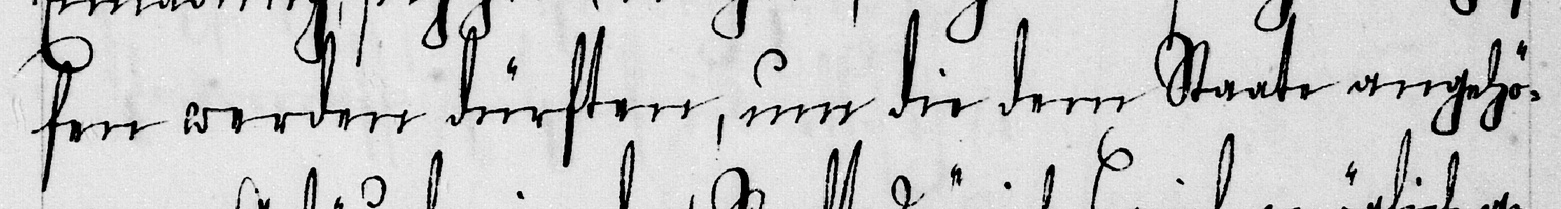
fen werden dürften, um die dem Staate angehö¬
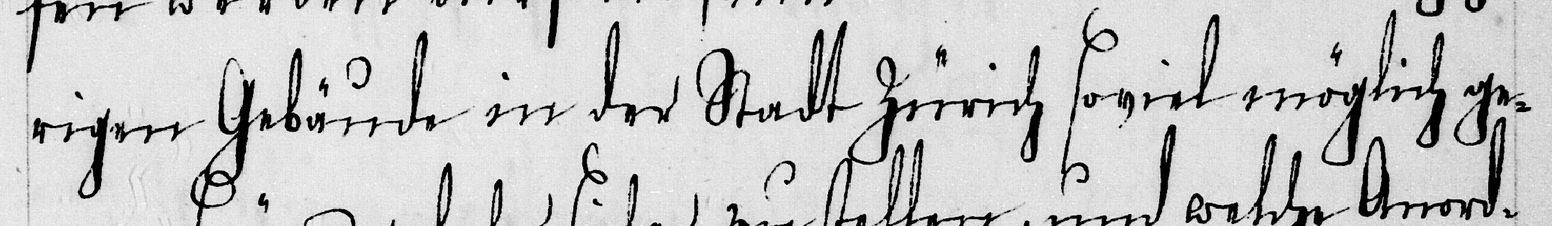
rigen Gebäude in der Stadt Zürich soviel möglich ge¬
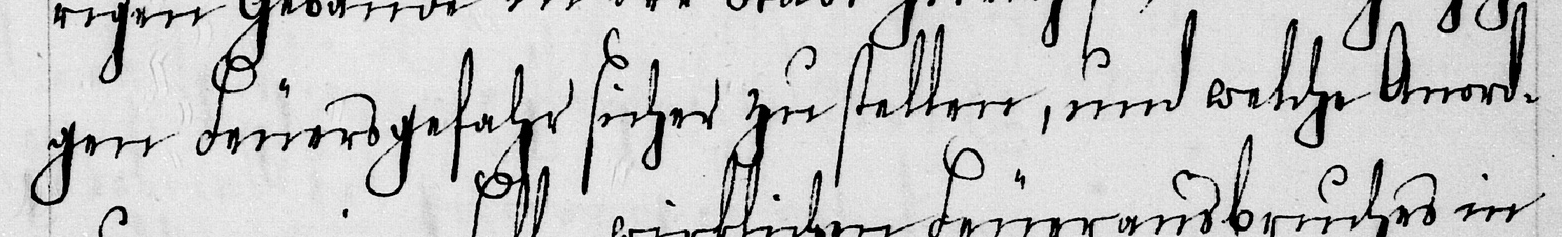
gen Feuersgefahr sicher zu stellen, und welche Anord¬
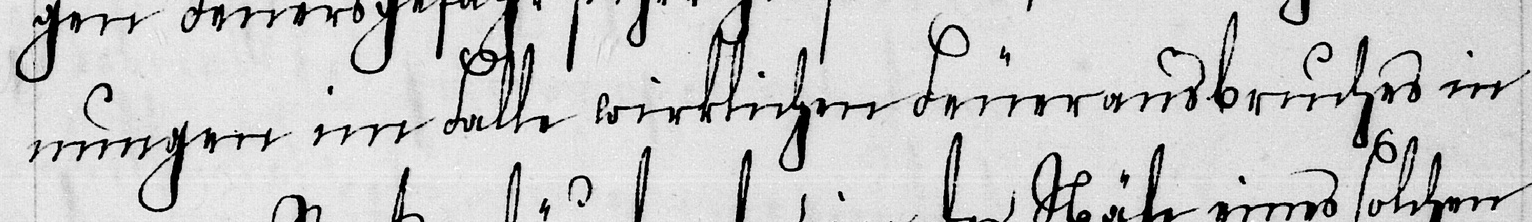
nungen im Falle wirklichen Feuerausbruches in
